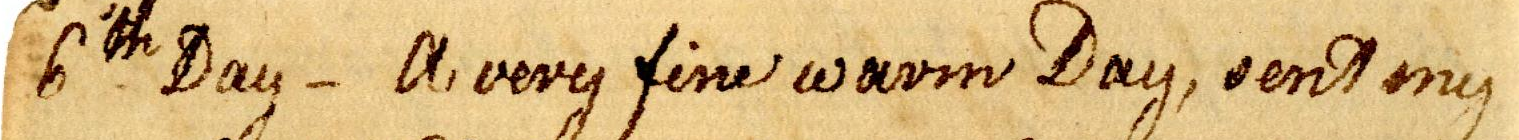6^th Day- A very fine warm Day, sent my
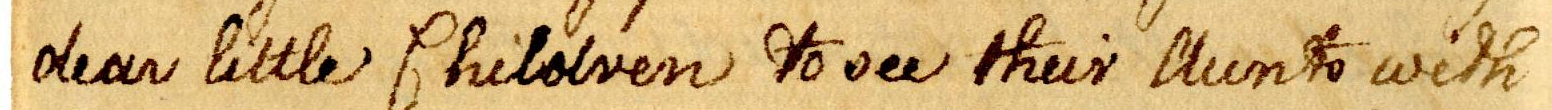dear little Children to see their Aunts with
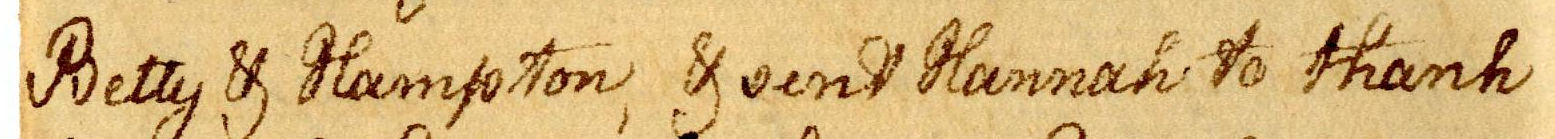Betty & Hampton & sent Hannah to thank
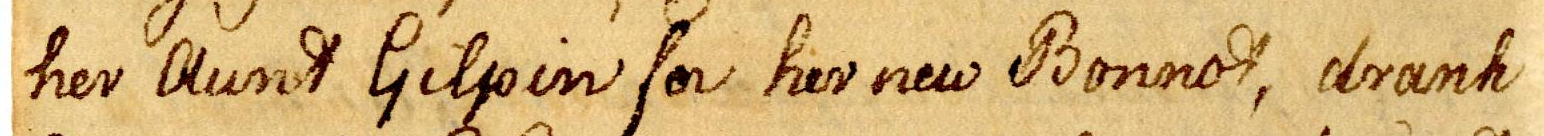her Aunt Gilpin for her new Bonnot, drank
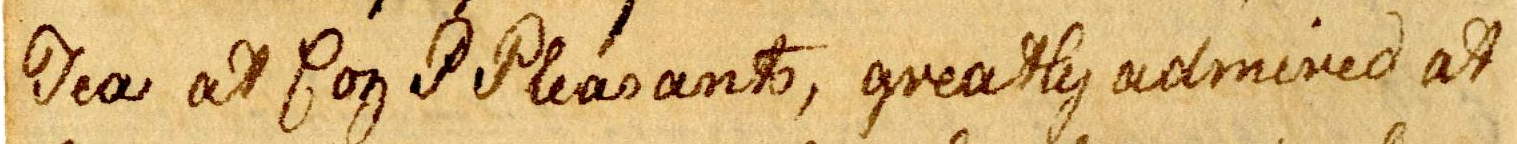Tea at Coz P Pleasants, greatly admired at
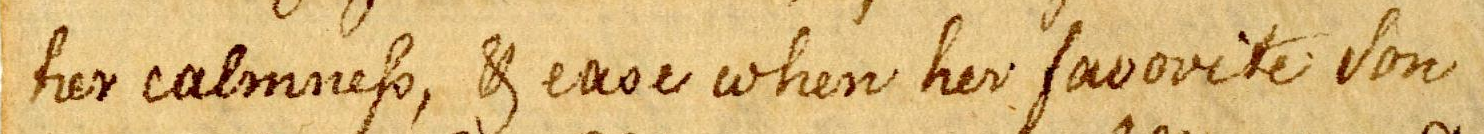her calmness, & ease when her favorite Son
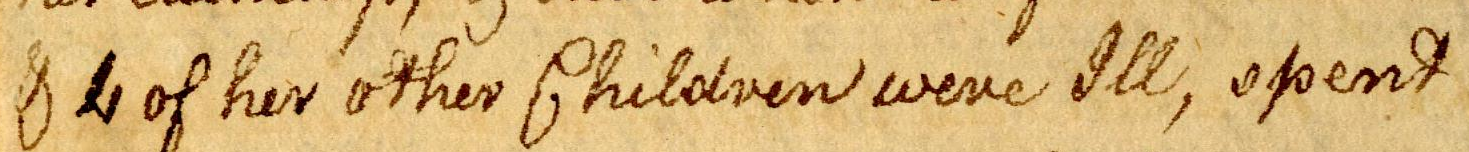& 4 of her other Children were Ill, spent
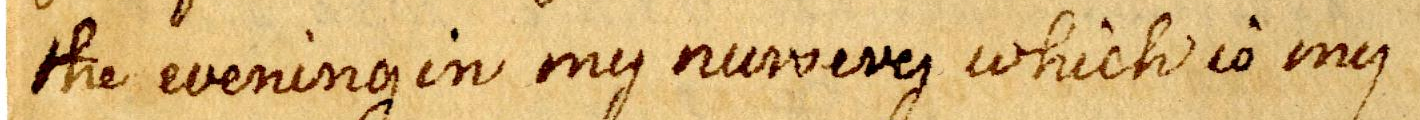the evening in my nursery which is my
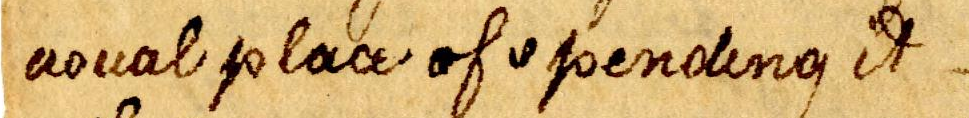usual place of spending it
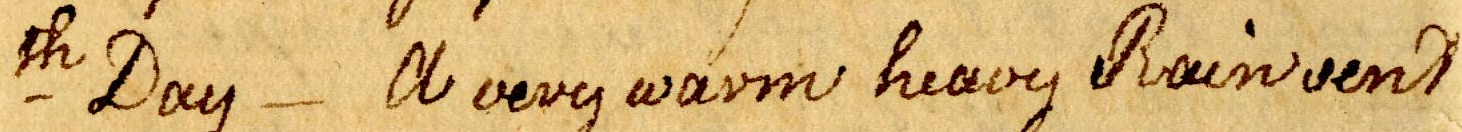7^th Day- A very warm heavy Rain sent
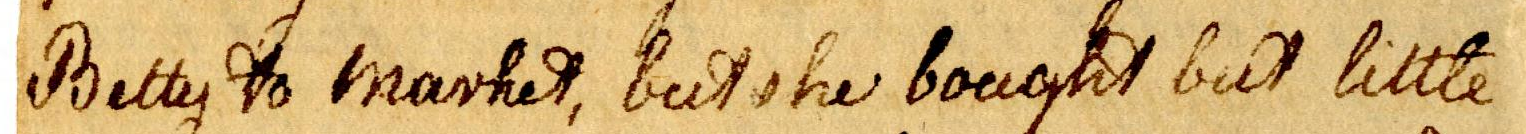Betty to Market, but she bought but little
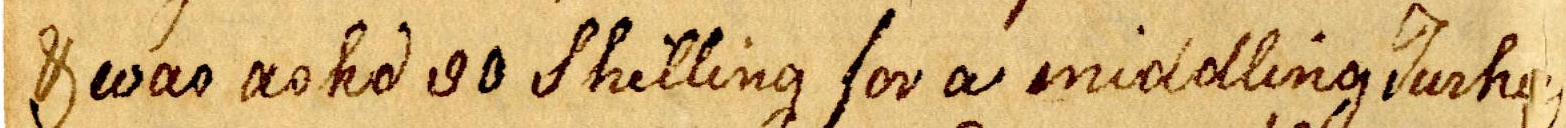& was askd 30 Shilling for a middling Turkey
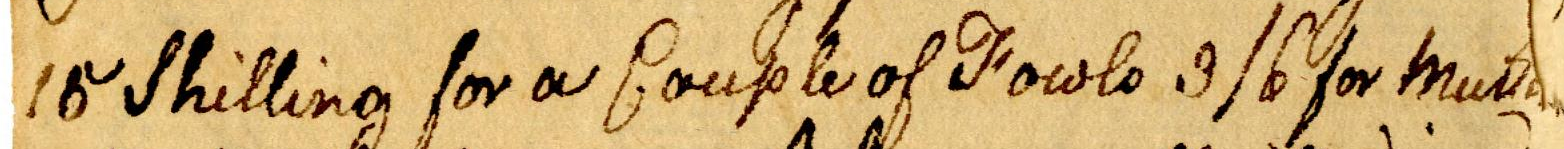15 Shilling for a Couple of Fowls 3s6 for Mutton
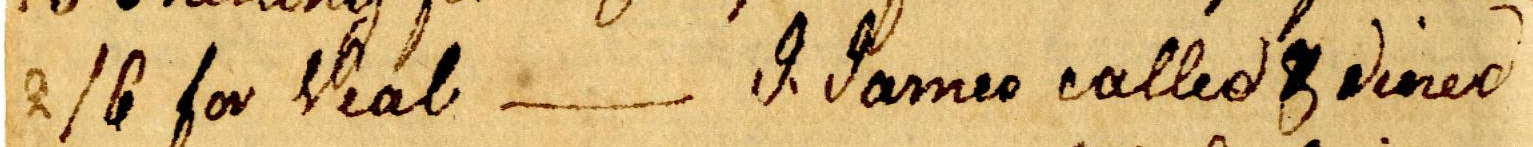2s6 for Veal- J James called & dined
